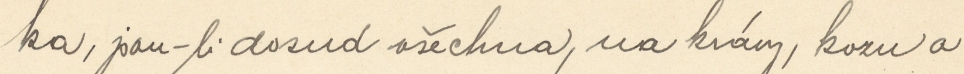ka, jsou-li dosud všechna, na krávy, kozu a
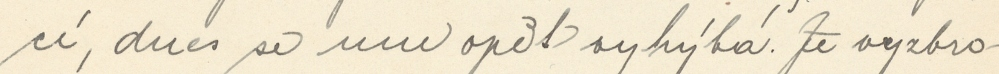cí, dnes se mu opět vyhýbá. Je vyzbro-
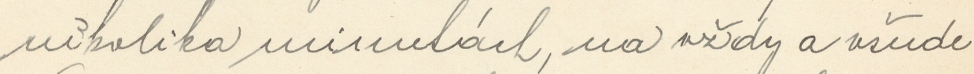několika minutách, na vždy a všude.
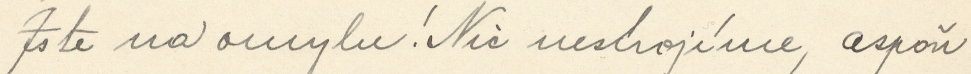Jste na omylu! Nic nestrojíme, aspoň
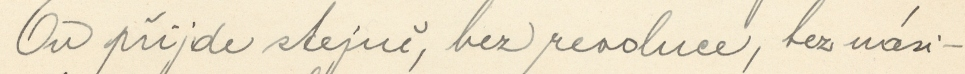On přijde stejně, bez revoluce, bez nási-
